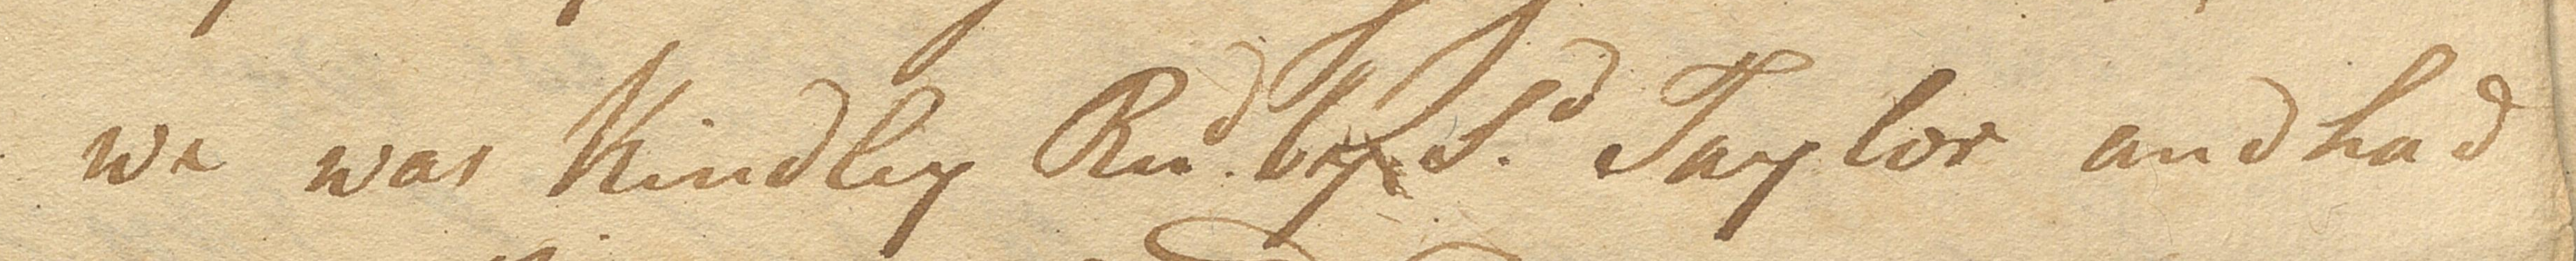we was Kindley Rec^d. by s^d. Taylor and had
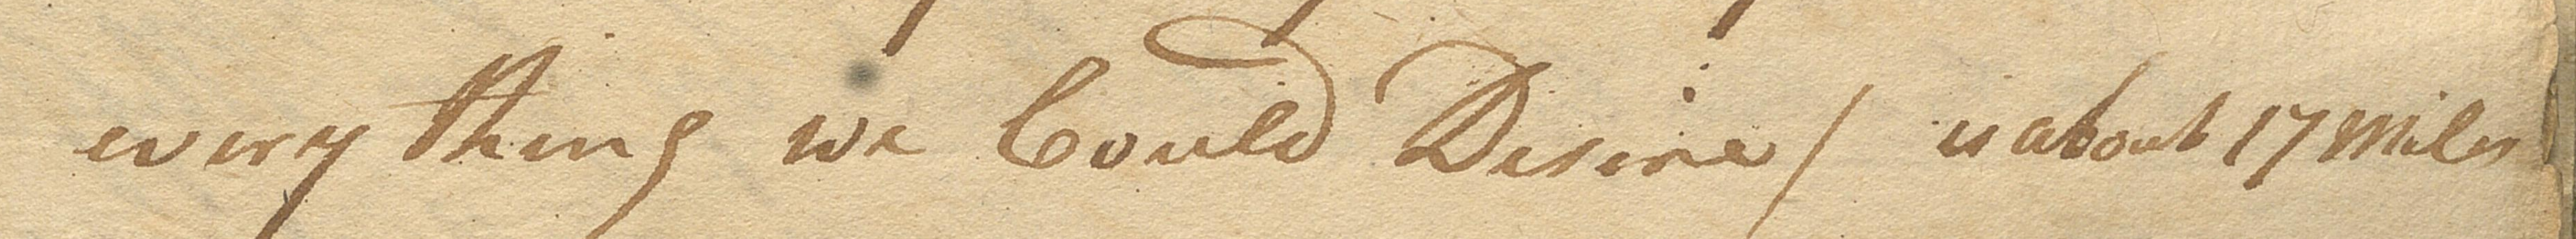every thing we Could Desire / is about 17 Miles
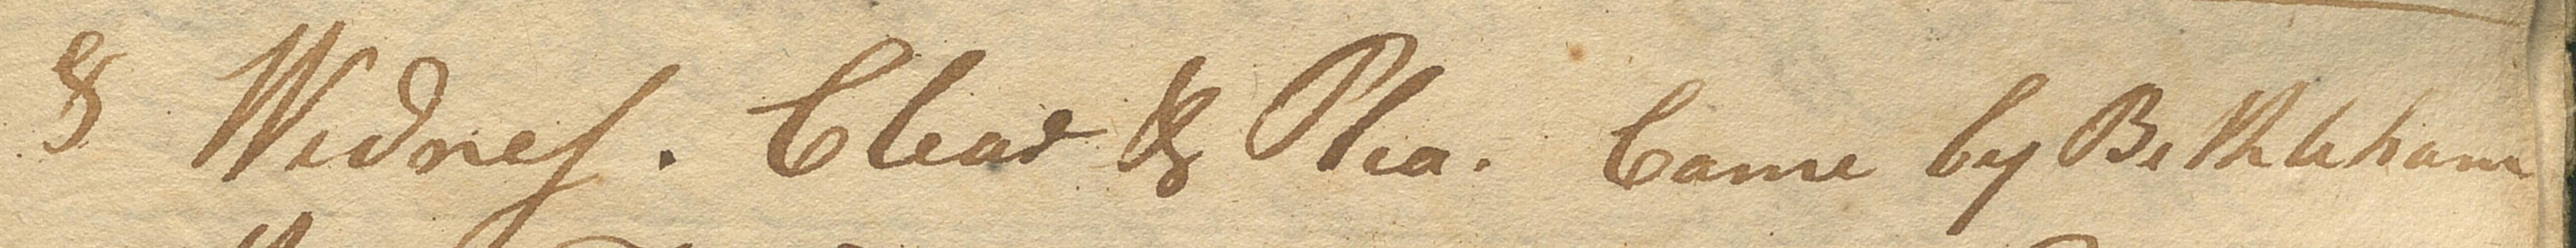8 Wednes. Clear & Plea. Came by Bethleham
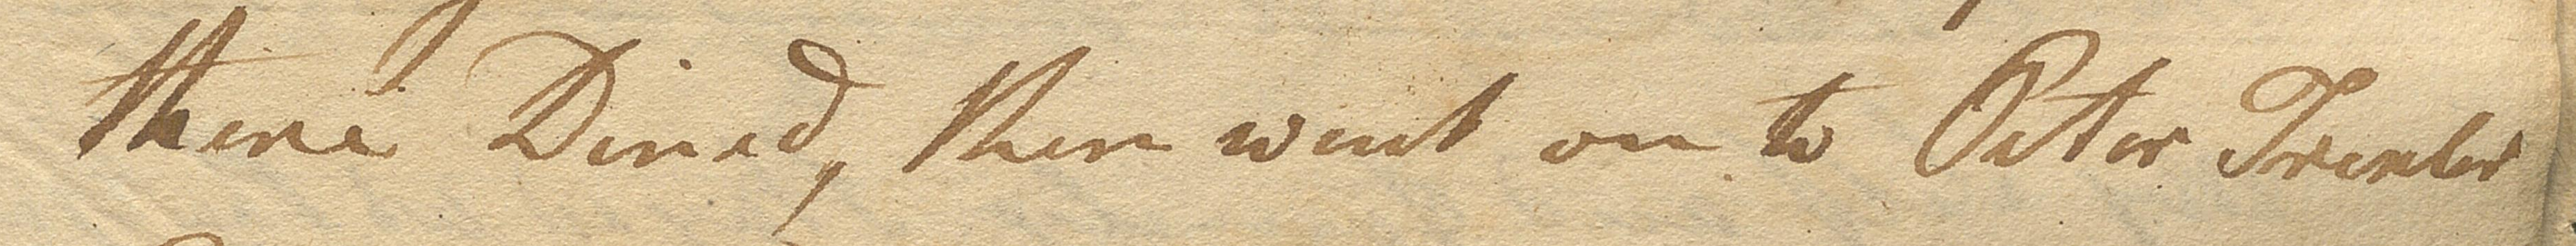there Dined, then went on to Peter Trenler
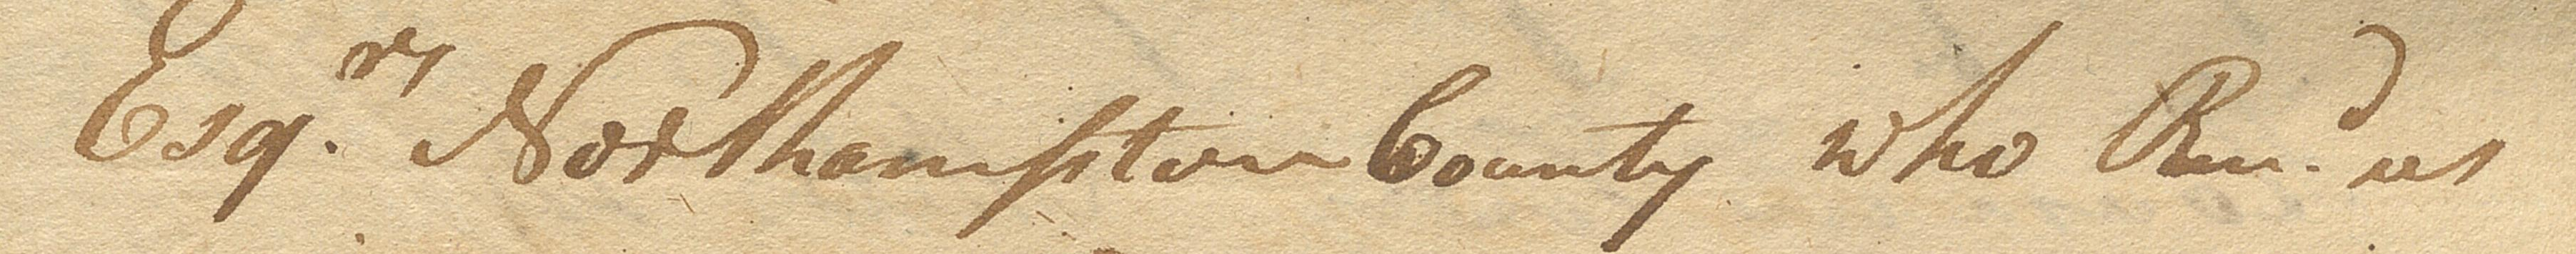Esq^r. Northempton County who Rec^d. us
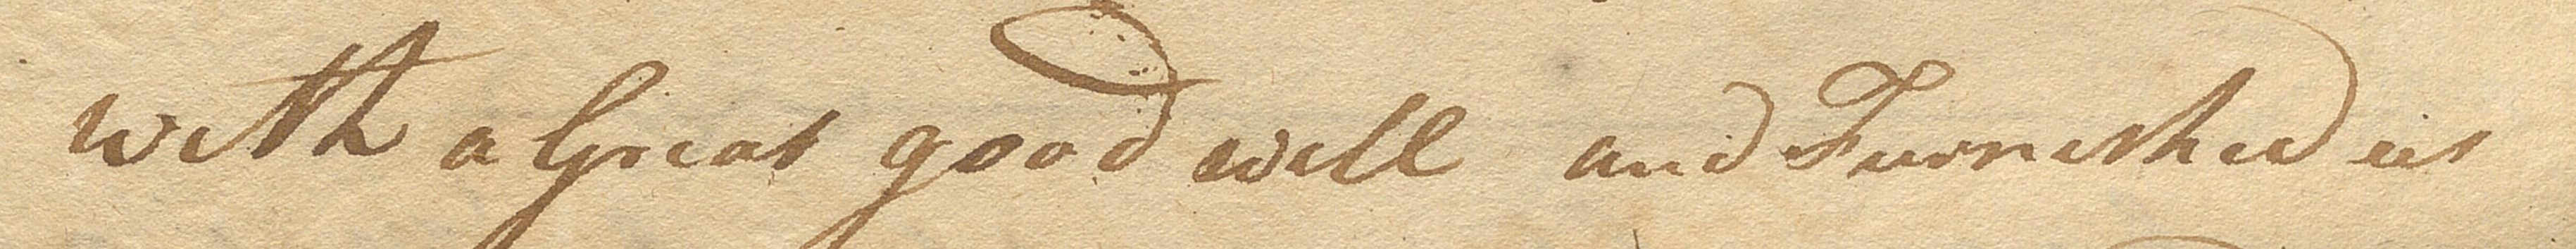with a Great good will and Furnished us
